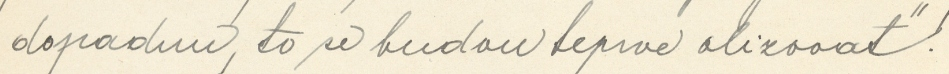dopadnu, to se budou teprve olizovat.“
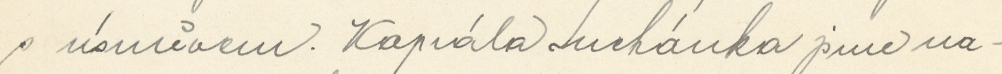s úsměvem. Kaprála Suchánka jsme na-
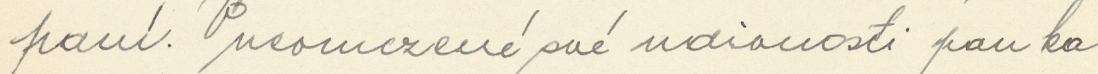paní. V neomezené své udivnosti pan ka-
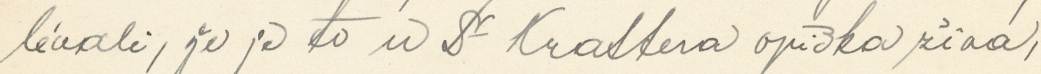lévali, že je to u Dr Krattera opička živá,
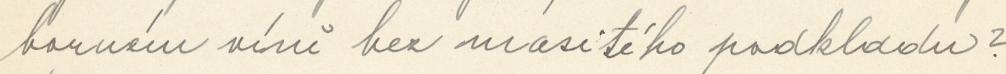borném víně bez masitého podkladu?
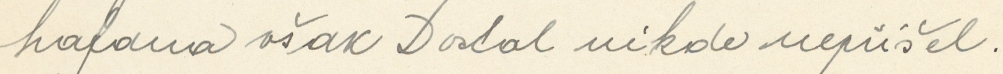hafana však Dostal nikde nepřišel.
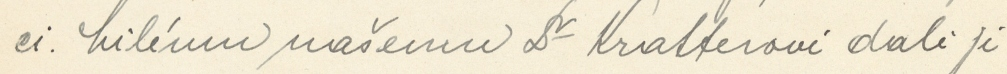ci. Milému našemu Dr Kratterovi dali ji
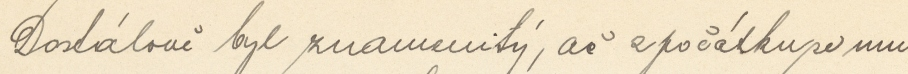Dostálově byl znamenitý, ač z počátku se mu
